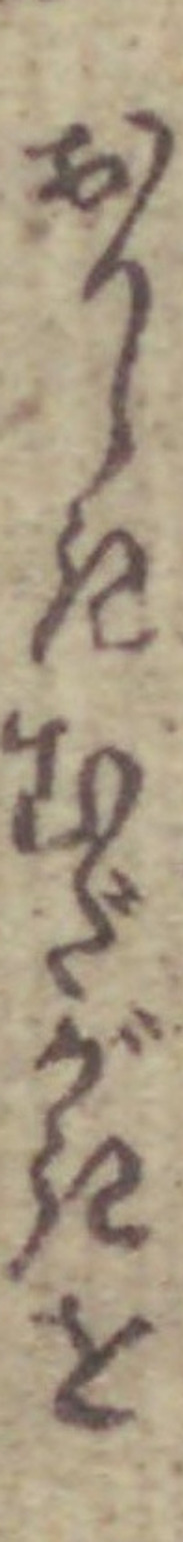おりしきむだがきを
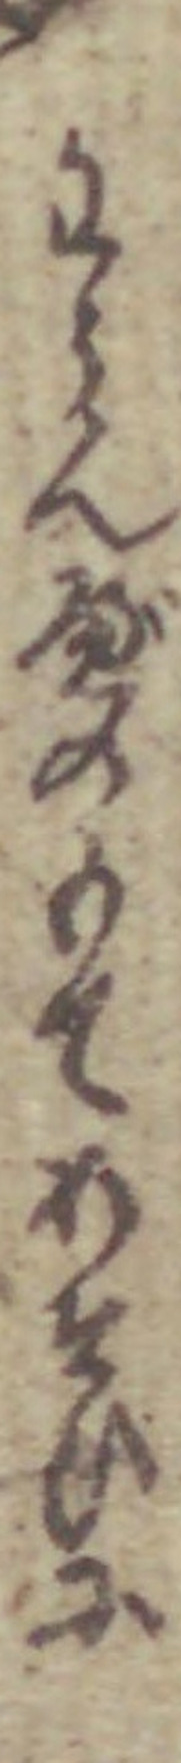わらんべのもてあそひに
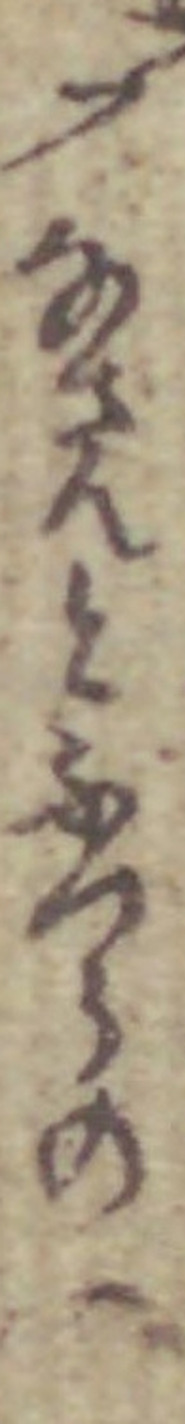なさんとふつうの
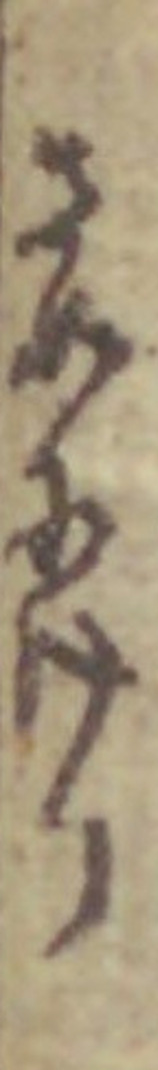さめにけり
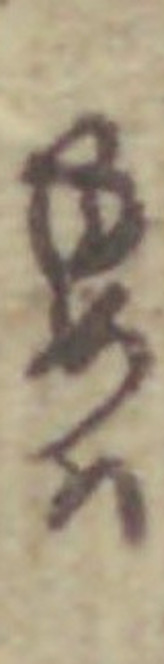ゆめは
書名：大通其面影 2巻
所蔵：国立国会図書館 National Diet Library, JAPAN
